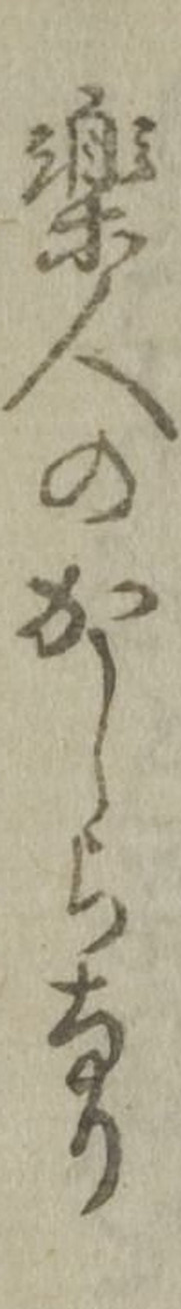樂人のかしらなり
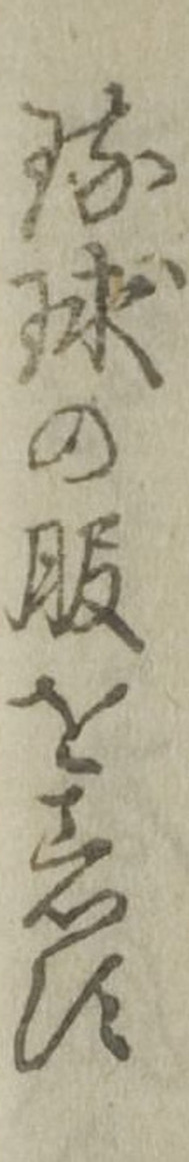琉球の服を着す
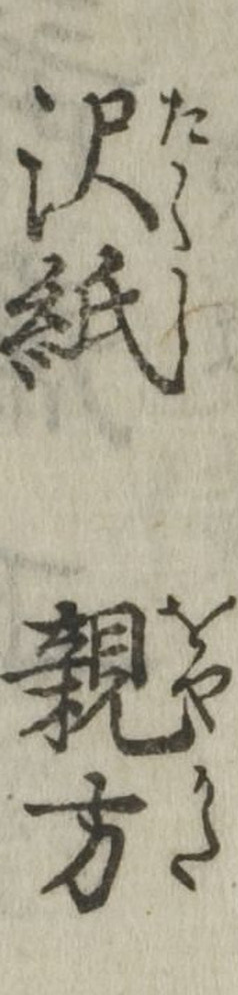沢紙親方
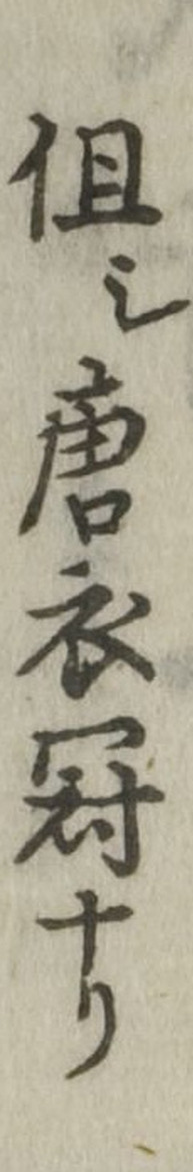但唐衣冠ナリ
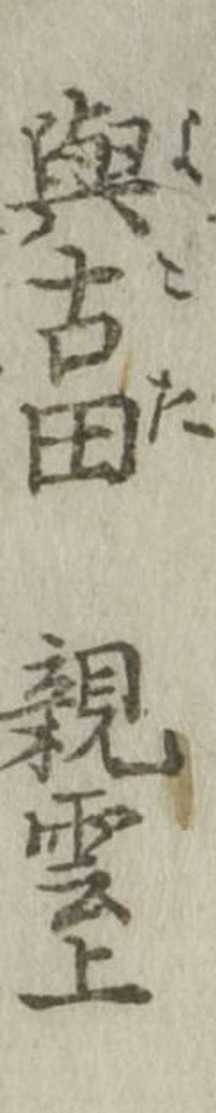與古田親雲上
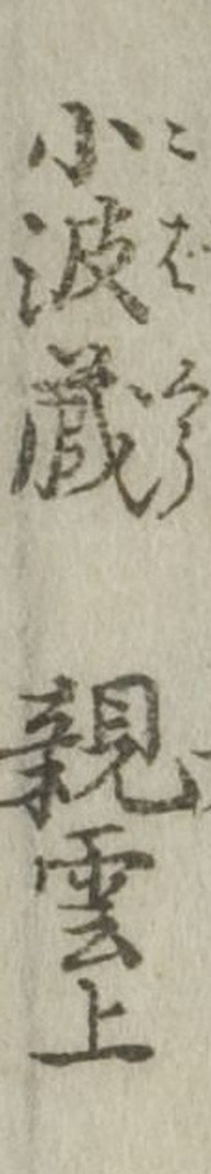小波蔵親雲上

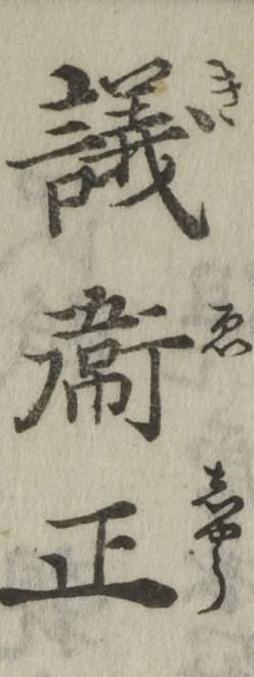議衛正
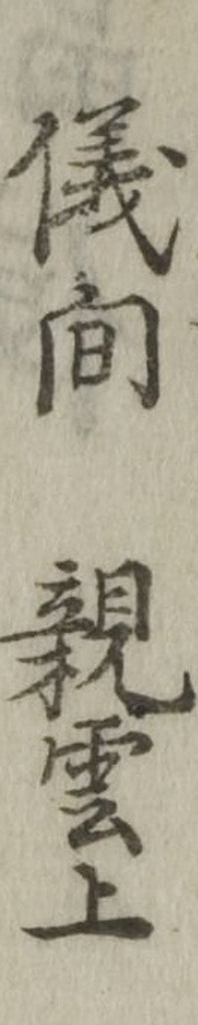儀間親雲上
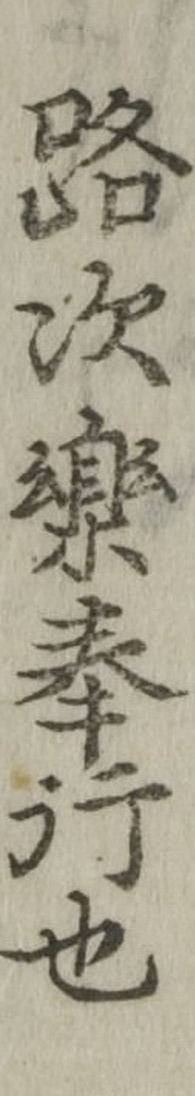路次樂奉行也
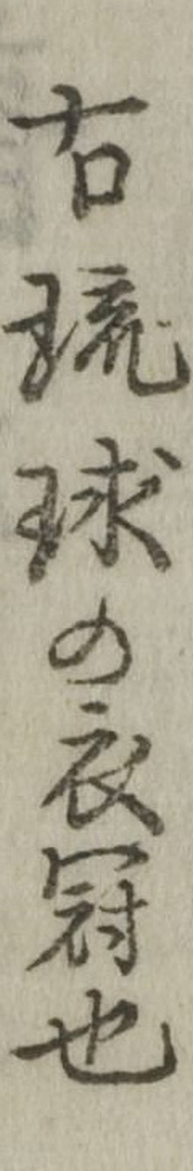古琉球の衣冠也
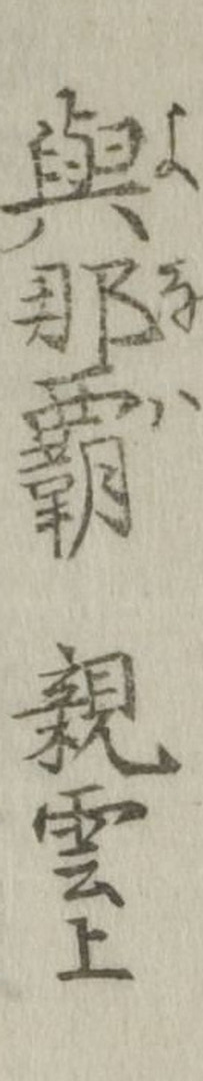與那覇親雲上
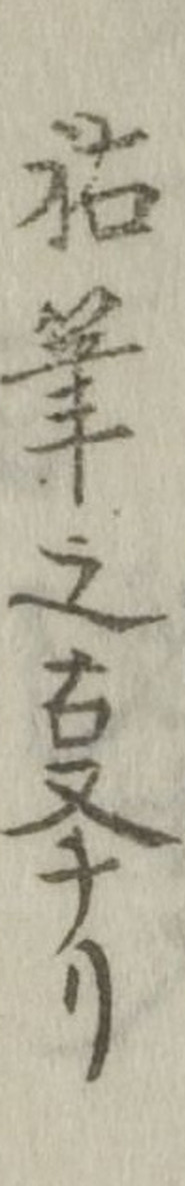祐筆之㕝ナリ
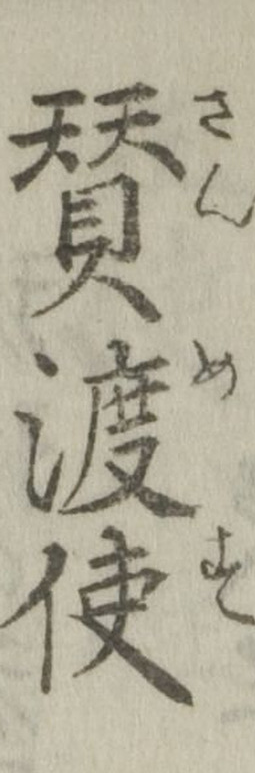賛渡使
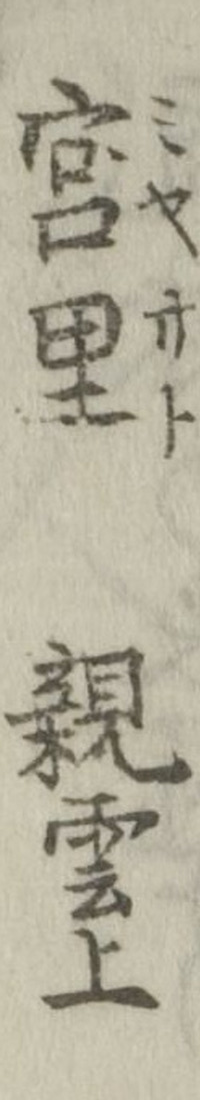宮里親雲上
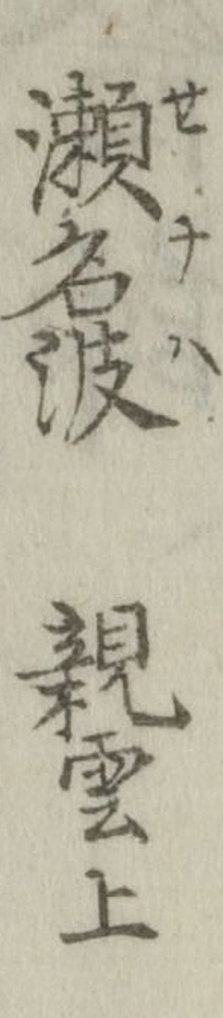瀬名波親雲上
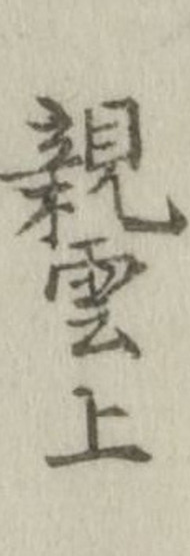浦嵜親雲上
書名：琉球人行列記 天保3年
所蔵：University of the Ryukyus Library
